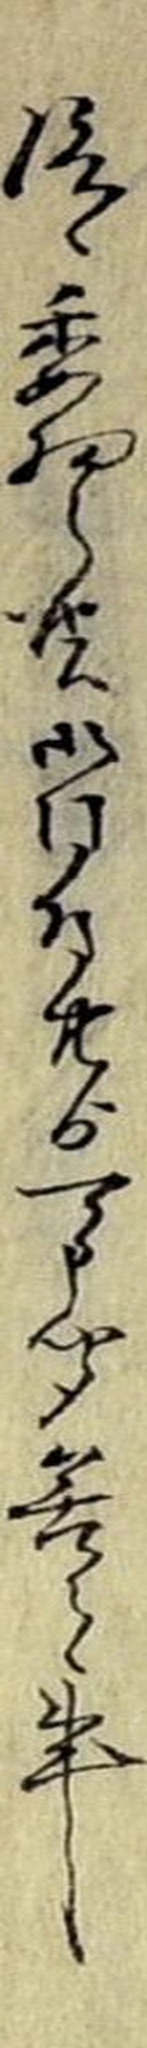渡候委細之儀ハ御目付共ゟ可申聞筈ニ候事
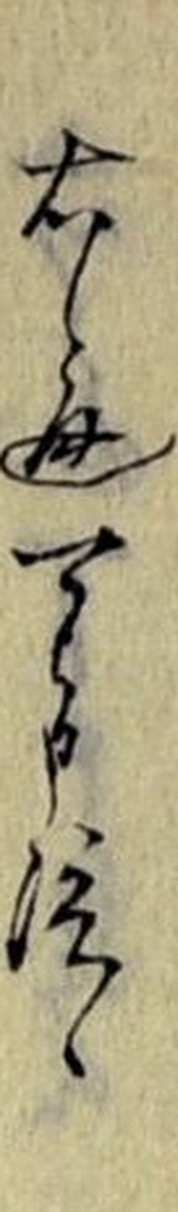右之通可申渡候
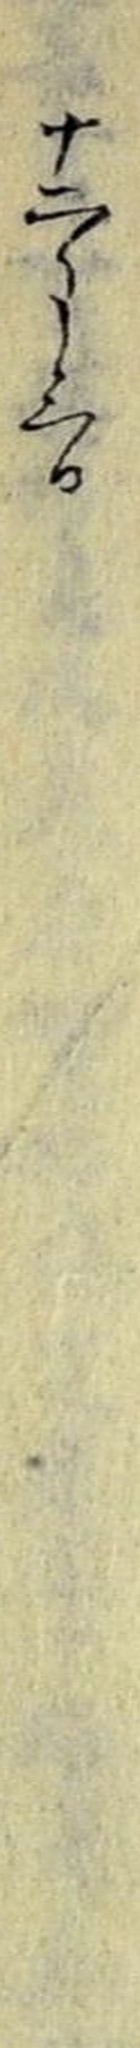十二月三日
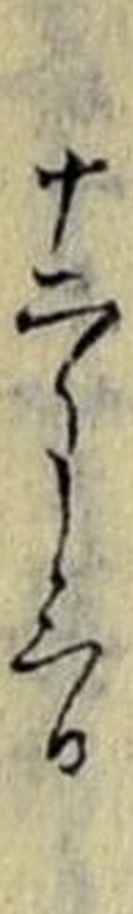十二月三日
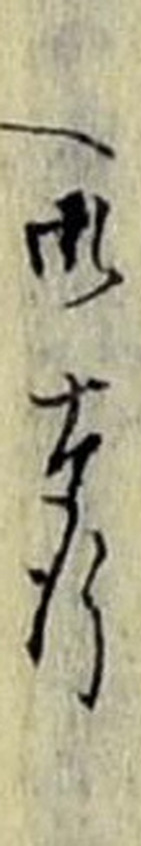御奉行
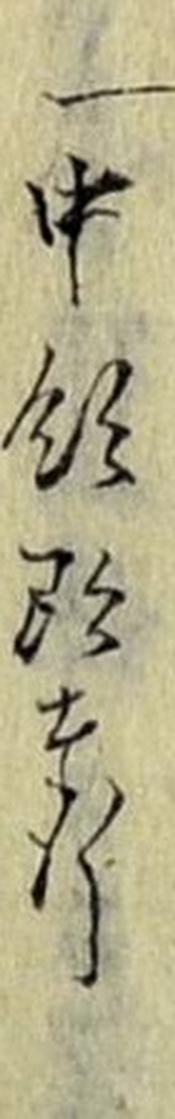中領郡奉行
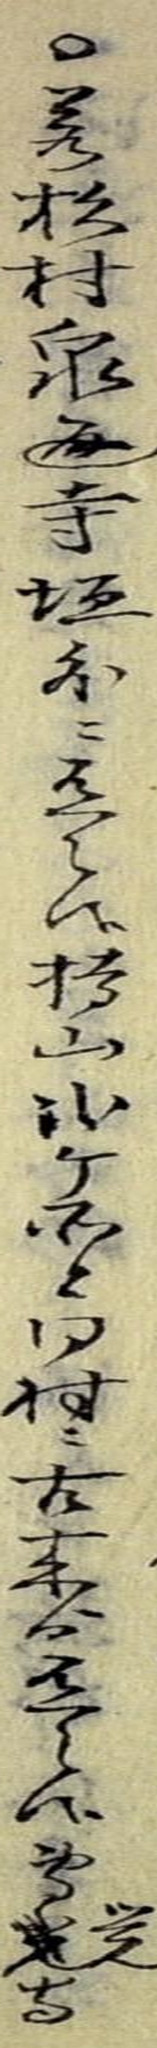○若杉村泉通寺垣外ニ有之候持山弐ケ所と同村ニ古来ゟ有之候専覚寺
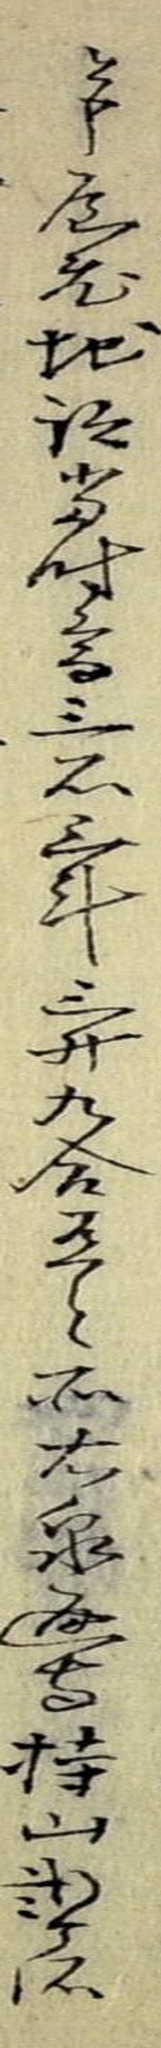と申屋敷地跡当時高三石三斗三升九合有之所右泉通寺持山弐ケ所
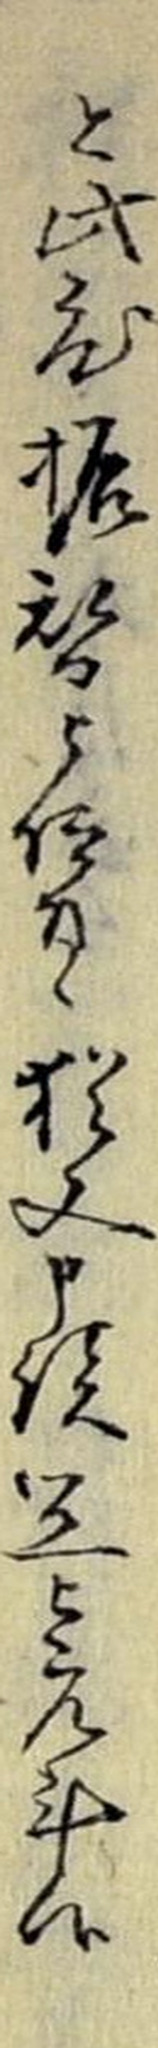と此度振替被仰付候猶又申談宜被取計候
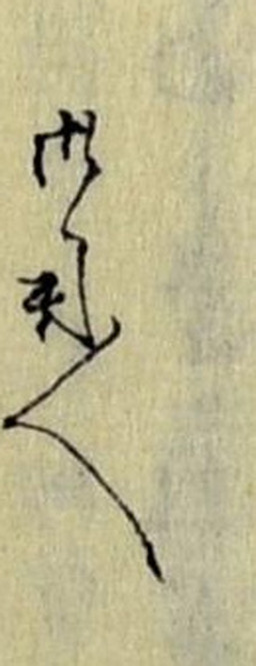御用人
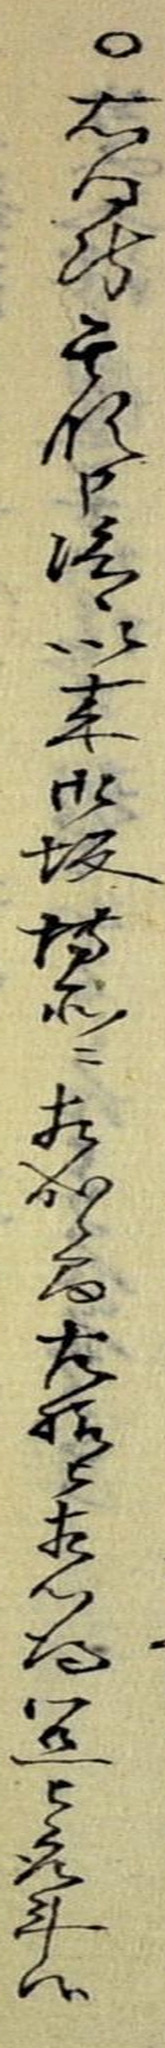○右同断其段申渡候以来御坂場所ニ相成候間左様被相心得宜被取計候
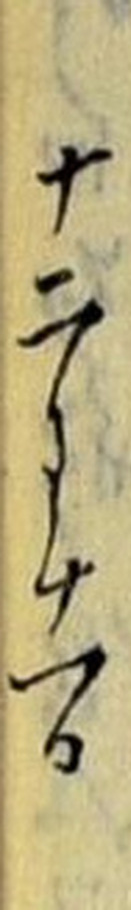十二月十一日
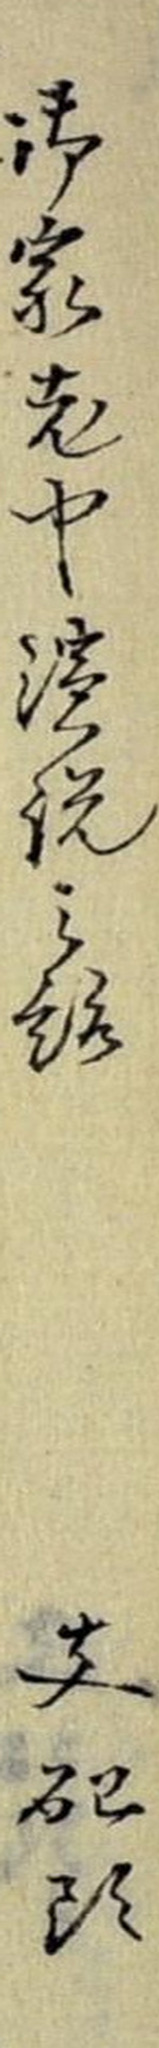御家老中演説之趣支配頭
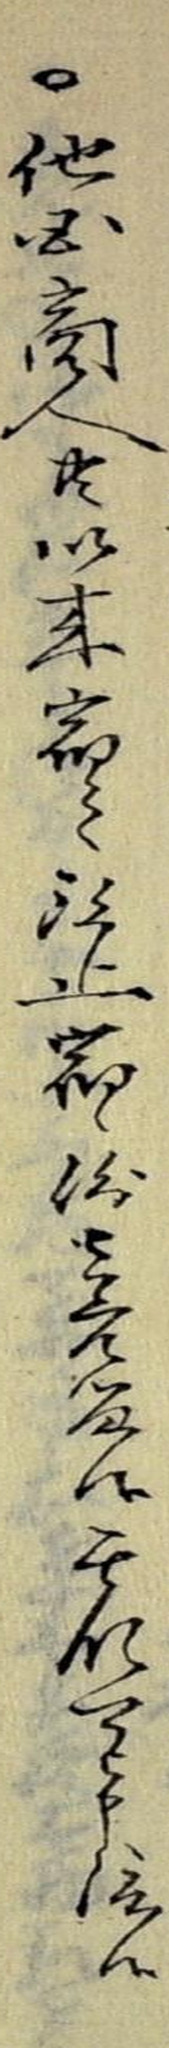○他国商人共以来宿々へ致止宿候儀被差留候其段可被申渡候
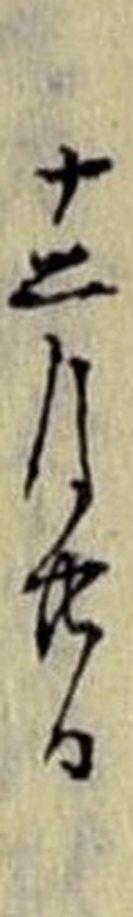十二月廿日
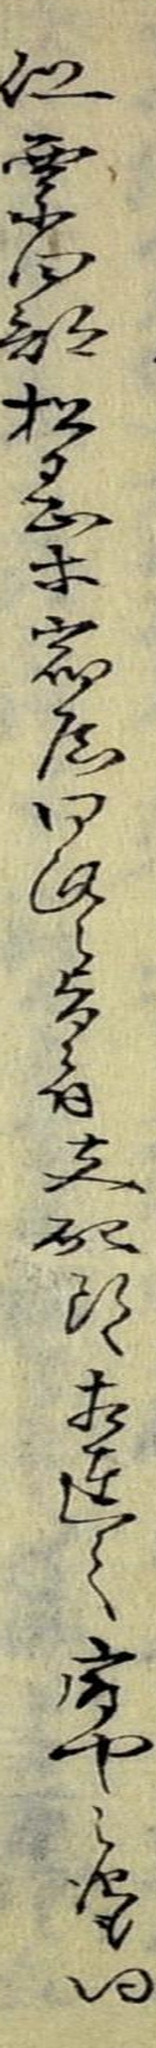但粟田部松岡等宿屋同趣之旨ニ付支配頭へ相達之府中之儀も同
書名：命令之部 五
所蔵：福井県文書館 Fukui Prefectural Archives
